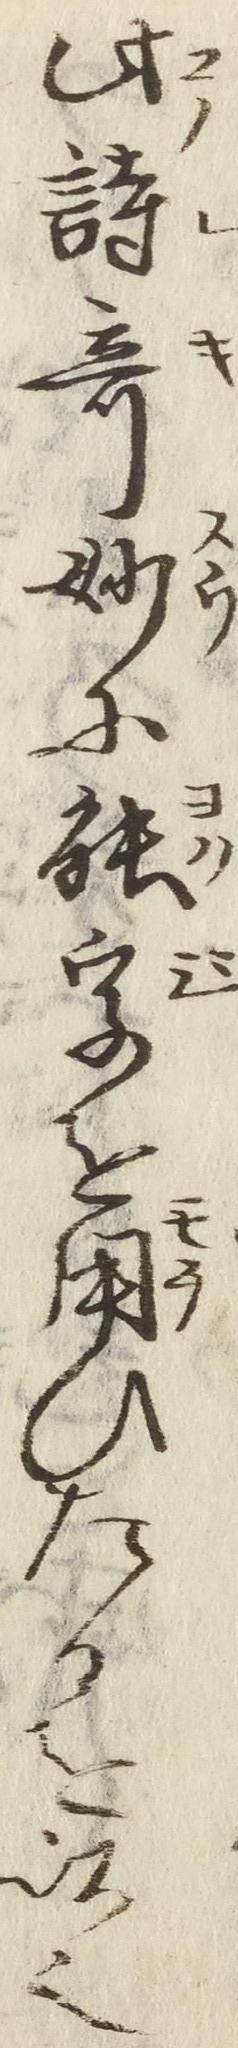此詩奇妙に能字を用ひたるを以也
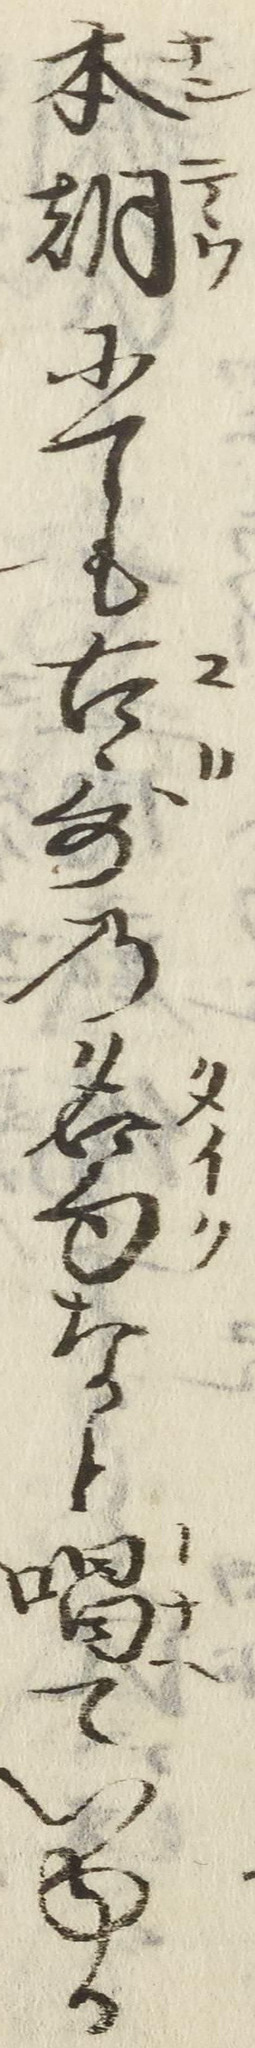本朝にても古歌の名句なと唱ていゆる
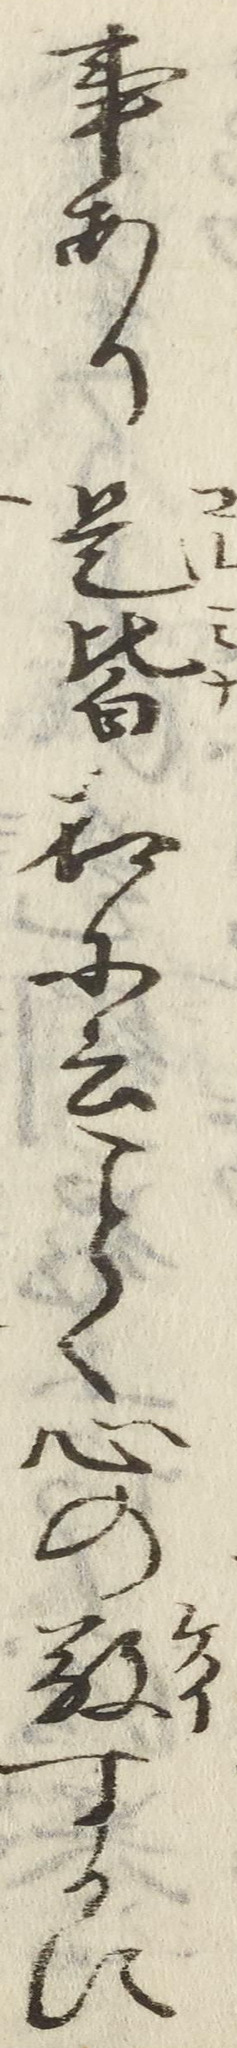事あり是皆右に云ことく心の敬するに
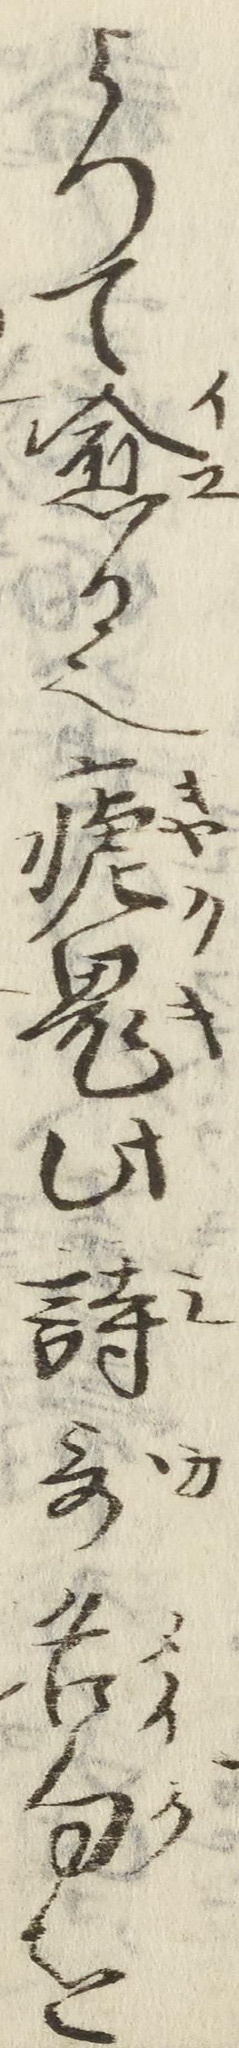よつて愈る也瘧鬼此詩歌名句を
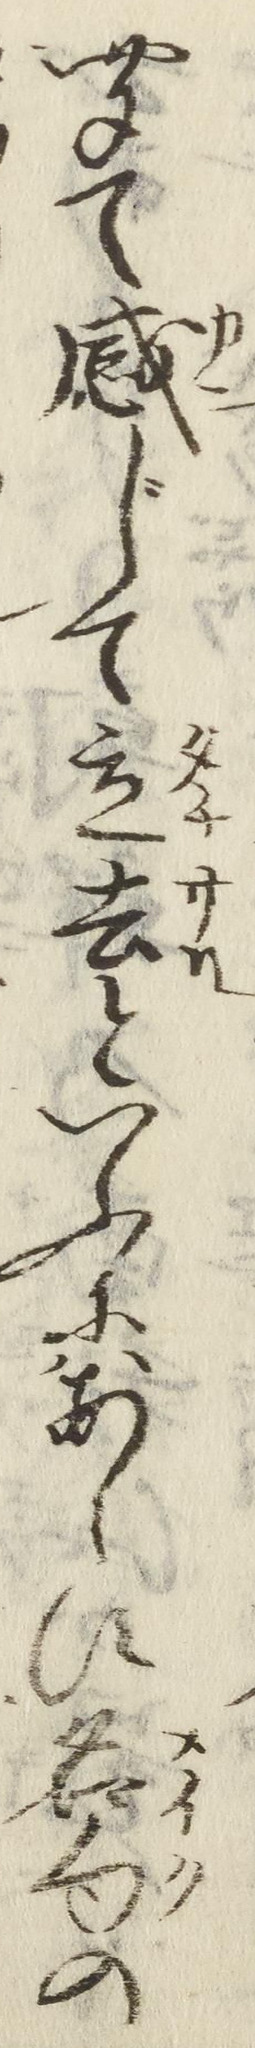聞て感じて立去といふにはあらす名句の
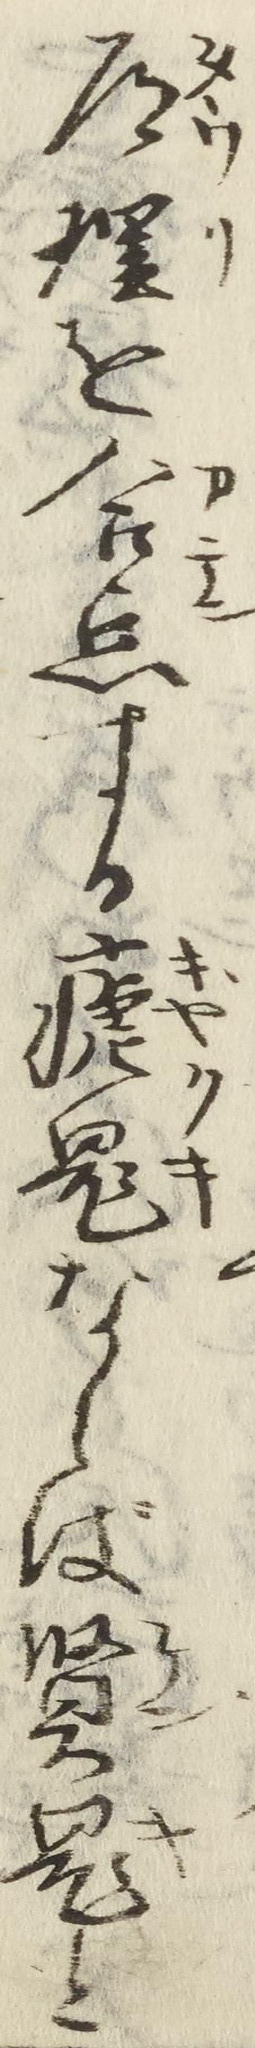道理を合点する瘧鬼ならば賢鬼と
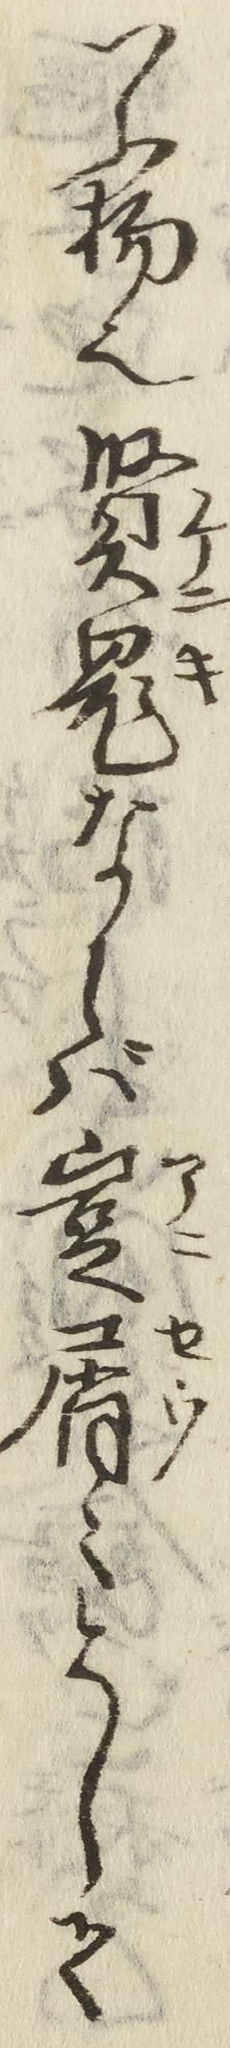いふ物也賢鬼ならば豈屑々として

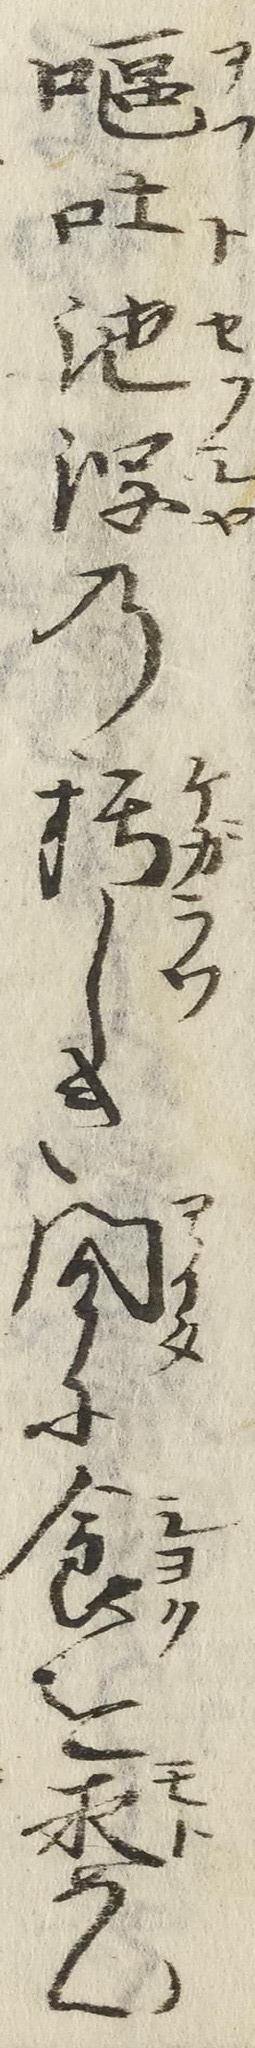嘔吐泄瀉の汚しき間に食を求めん
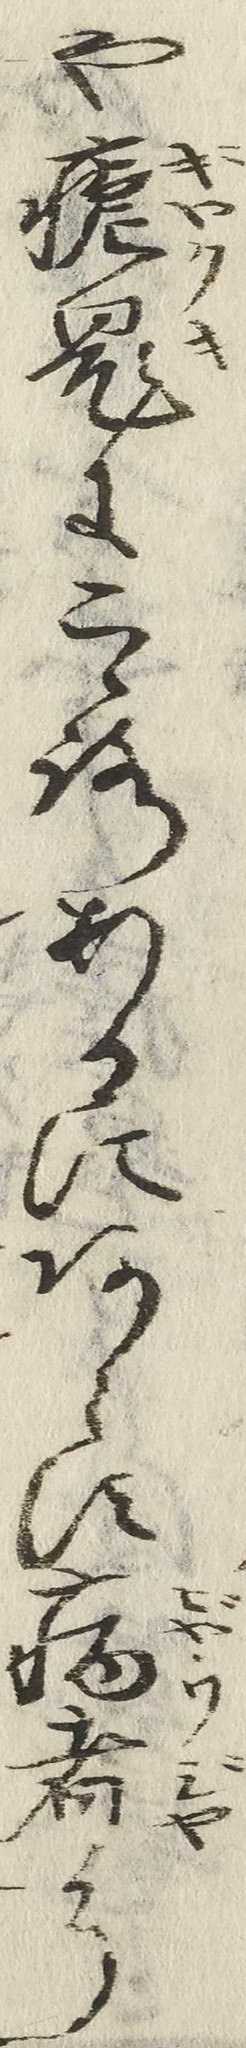や瘧鬼にこころあるにあらす病者に
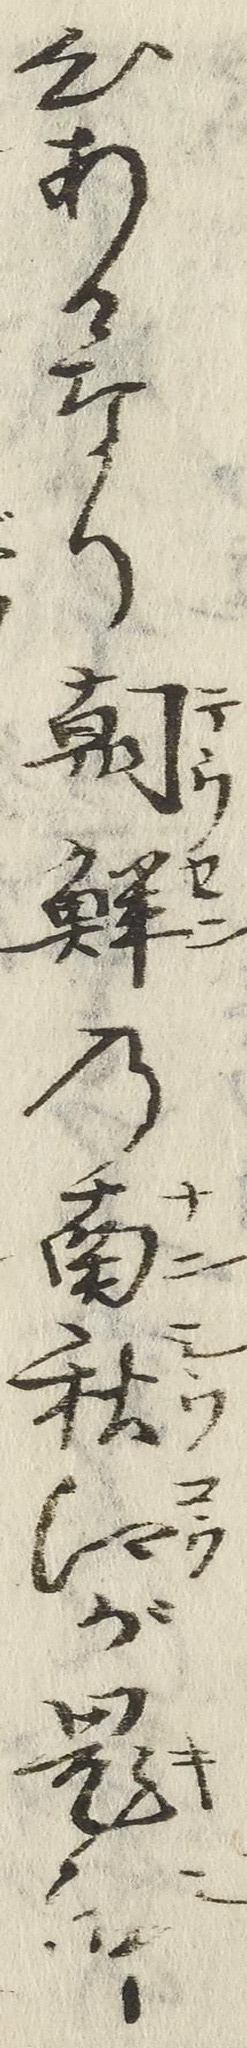心あるなり朝鮮の南秋江が鬼神
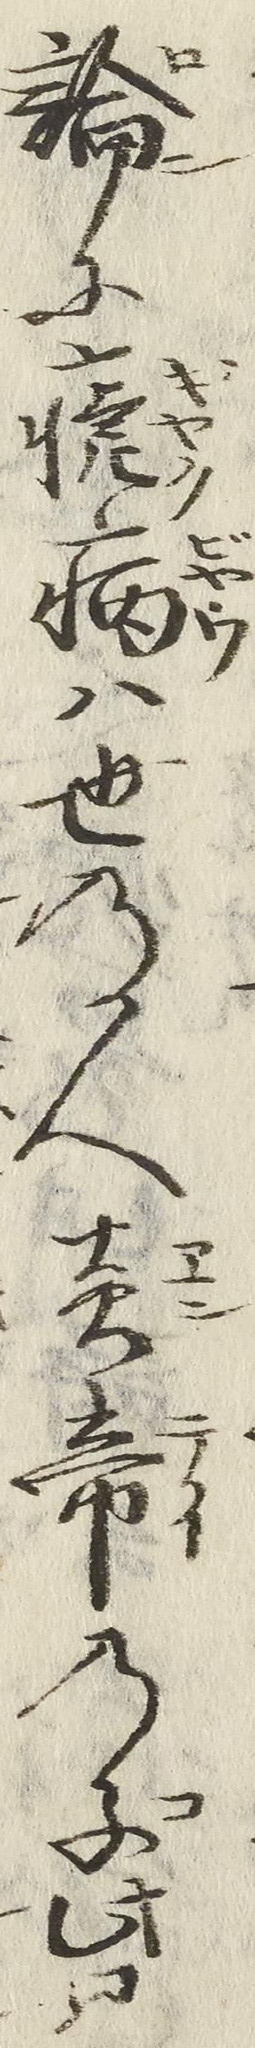論に瘧病は世の人炎帝の子此鬼
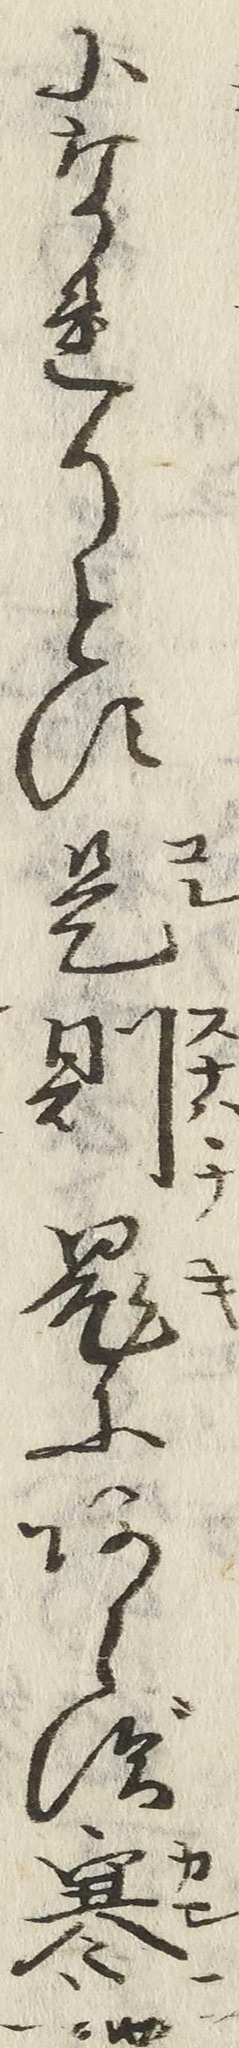になれりとす是則鬼にあらず寒熱
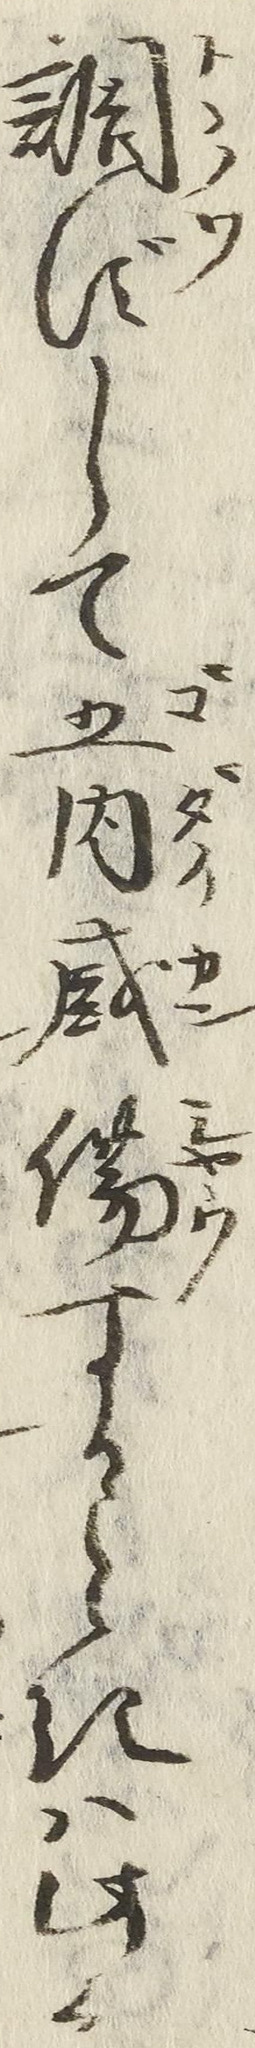調ずして五内感傷するときは此病
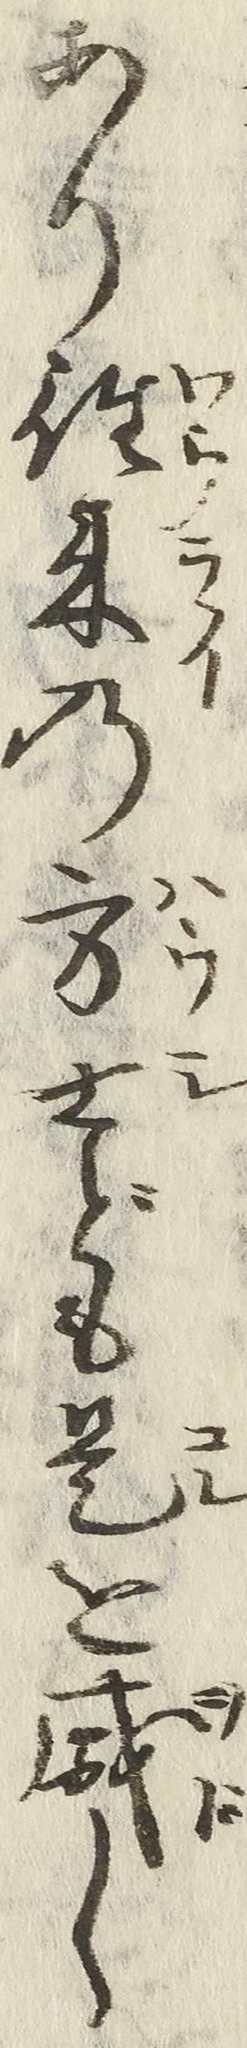あり往来の方士ども是を威し是
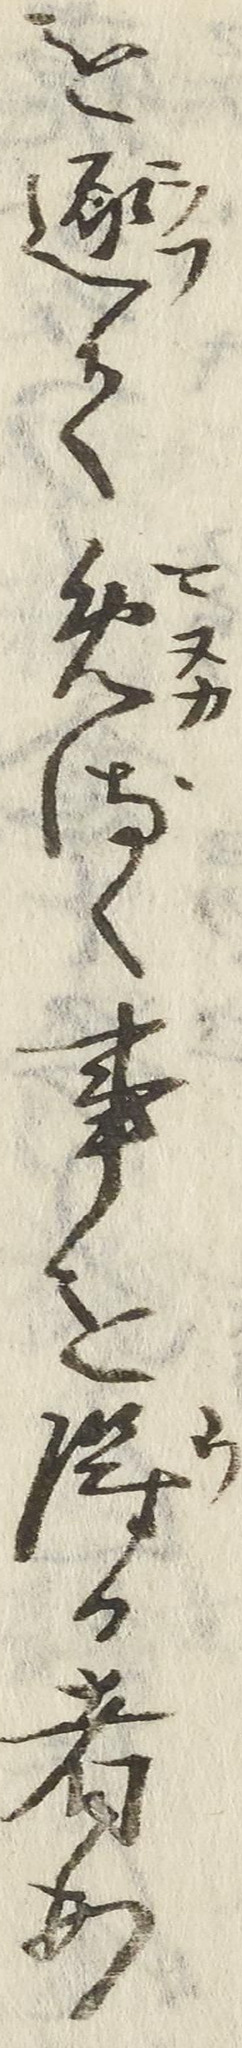を逐て免るゝ事を得る者あり
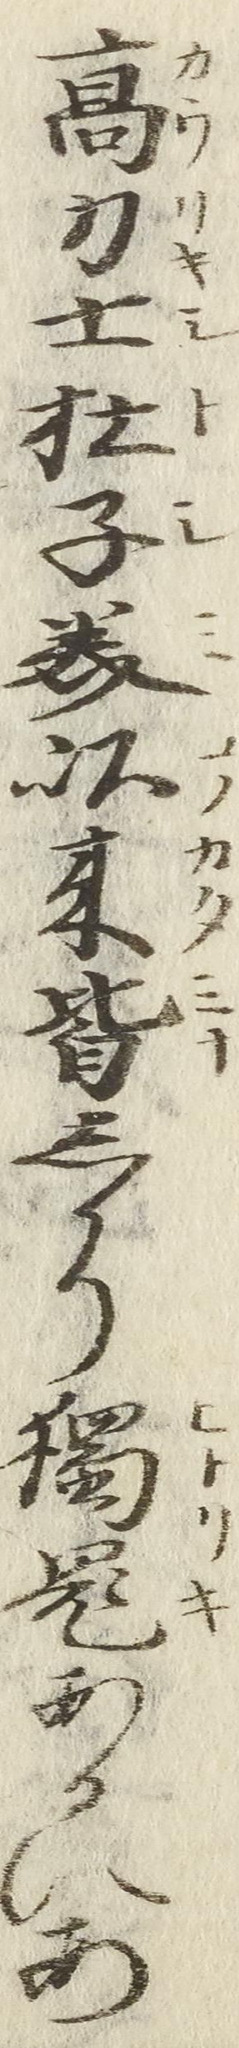高力士杜子美以来皆しかり独鬼あるにあ
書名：天地或問珍　地
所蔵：東京大学地震研究所図書室 Earthquake Research Institute Library, The University of Tokyo, JAPAN
